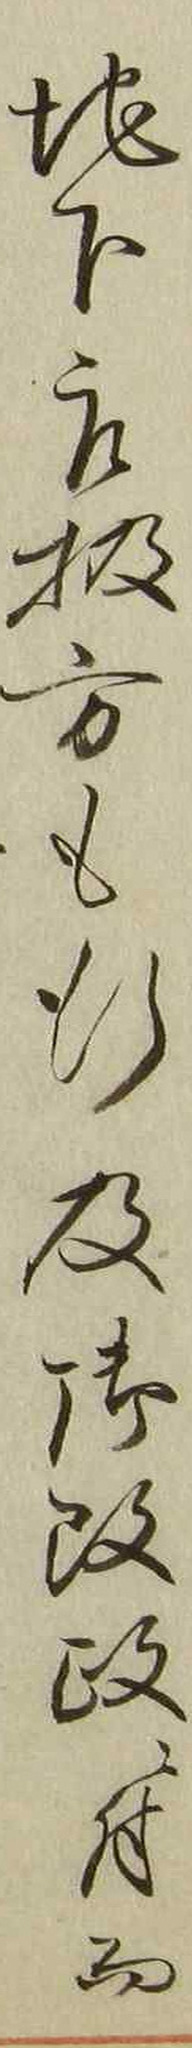地下取扱方も行及御改政ニ付而
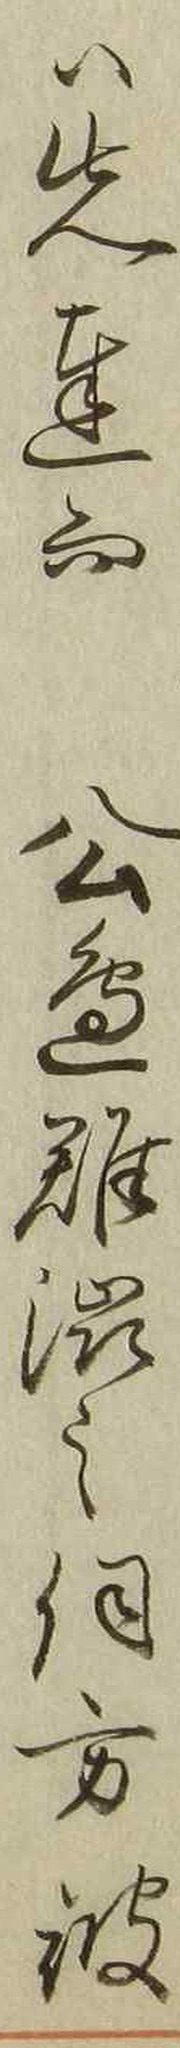ハ先達而公辺難渋之伺方彼
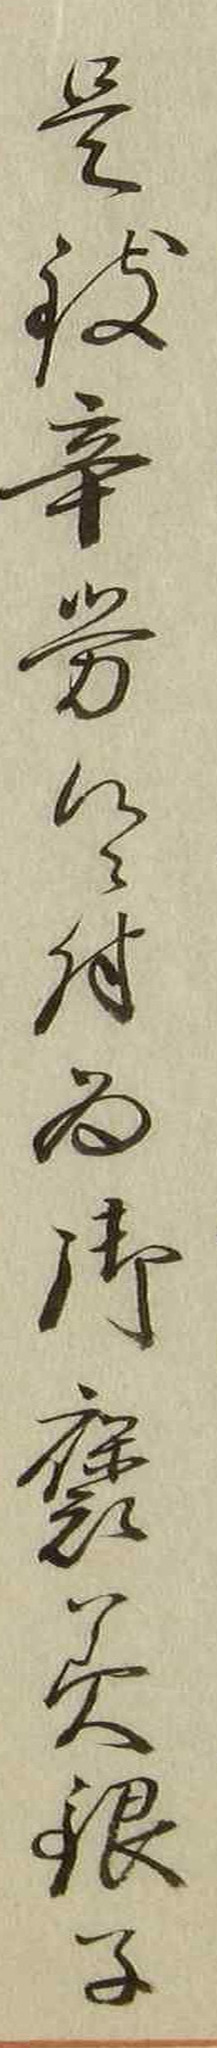是致辛労候ニ付為御褒美銀子
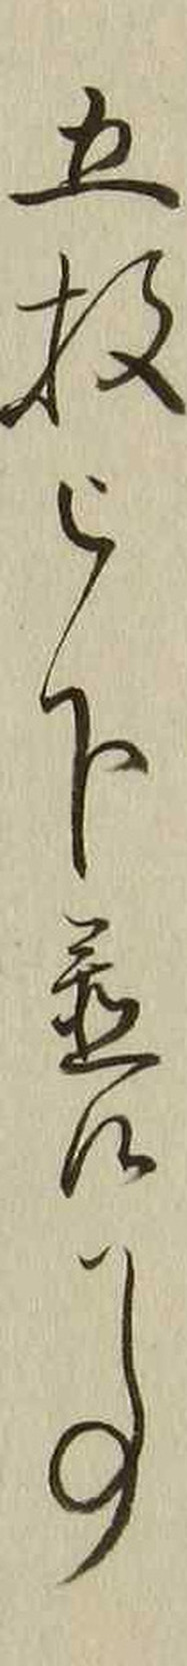五枚被下置候事
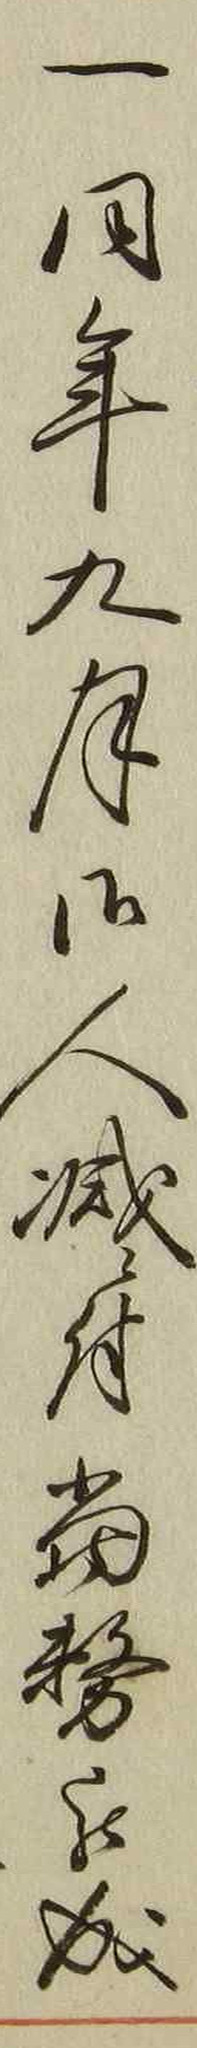一同年九月御人減ニ付当務被成
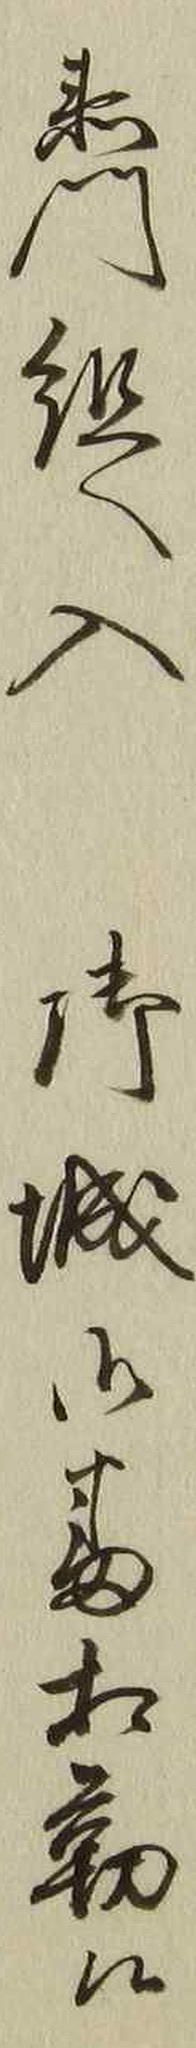衛門組へ入御城御番相勤候
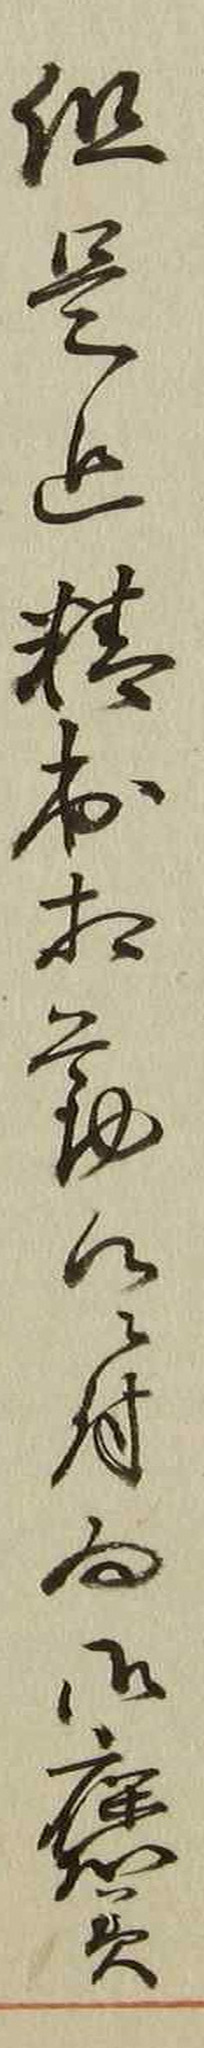但是迄精出相勤候ニ付而御褒美
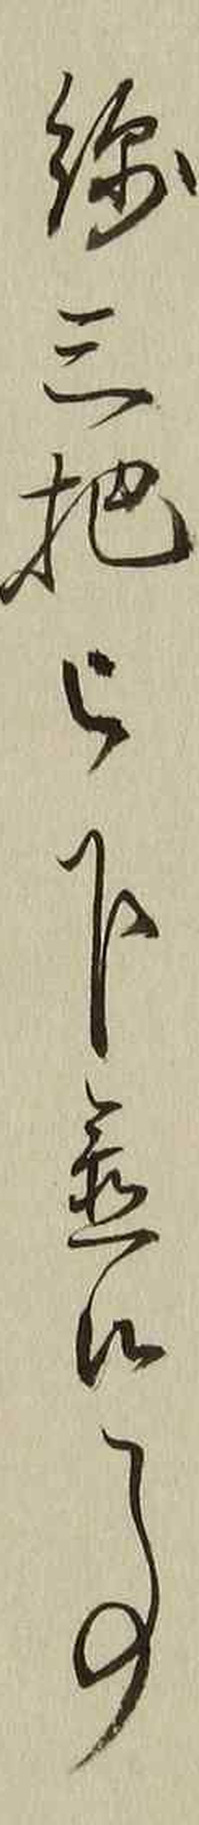綿三把被下置候事
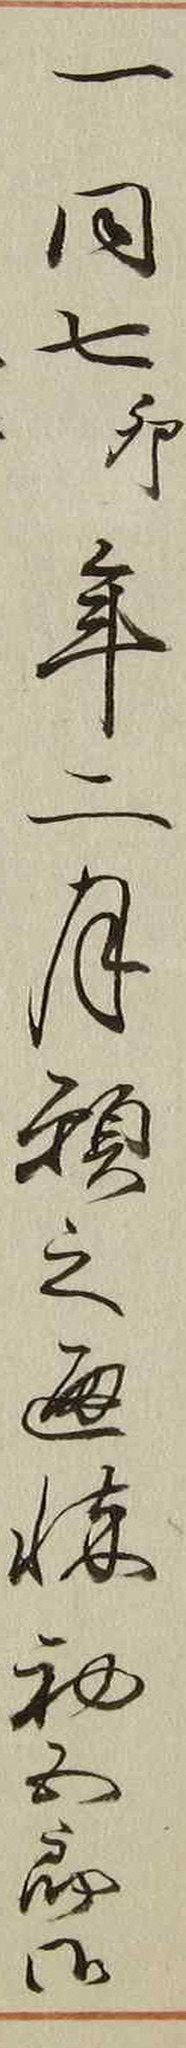一同七卯年二月願之通忰初五郎御
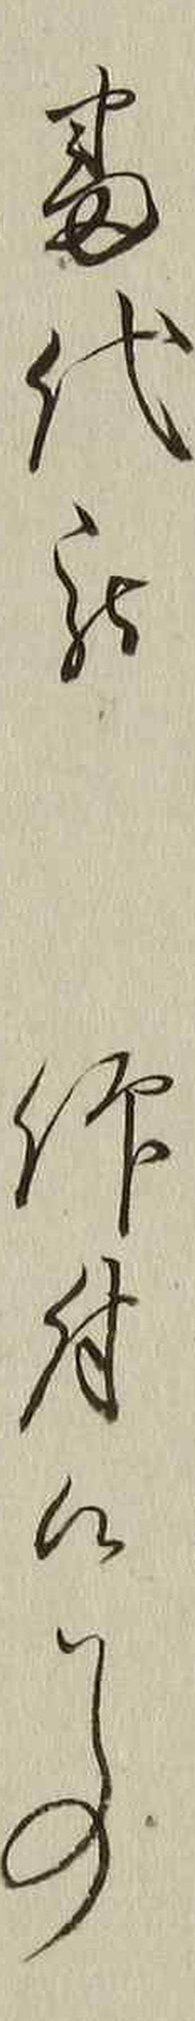番代被仰付候事
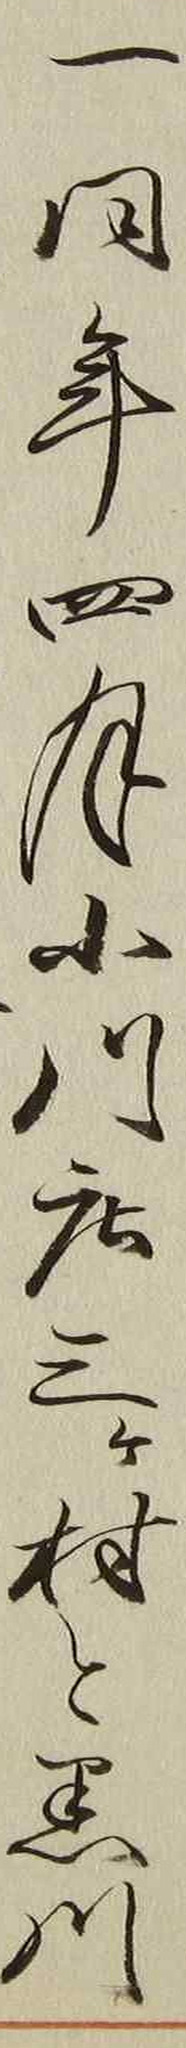一同年四月小川庄三ヶ村と黒川
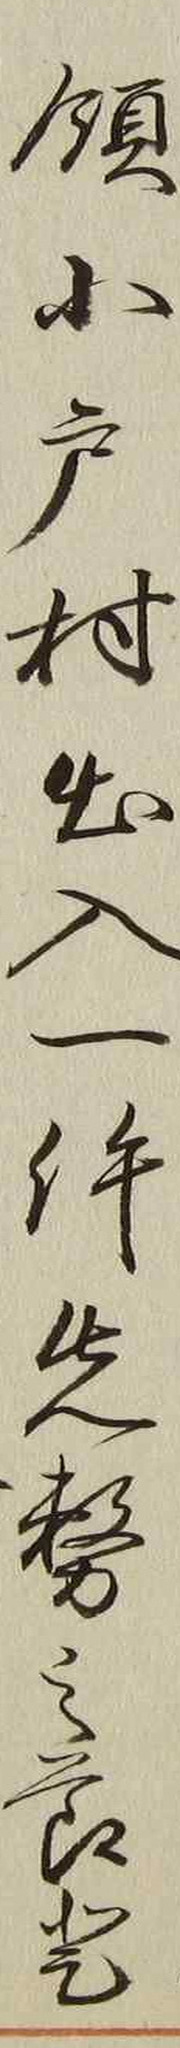領小戸村出入一件先務之節登
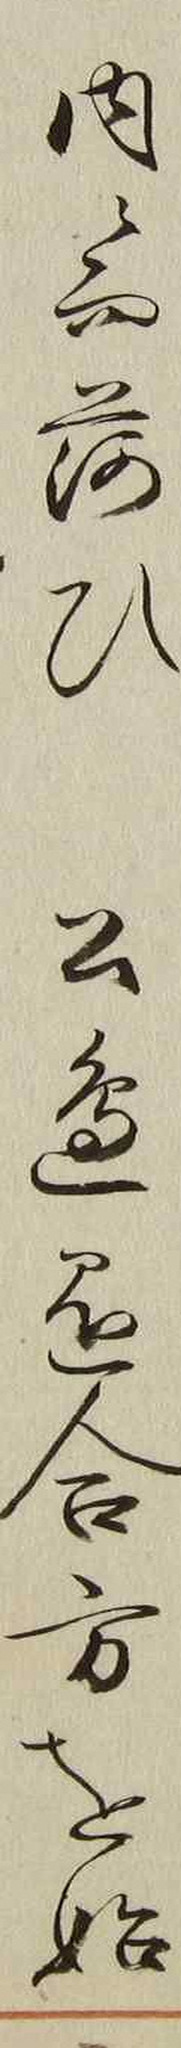内ニ而荷ひ公辺懸合方を始
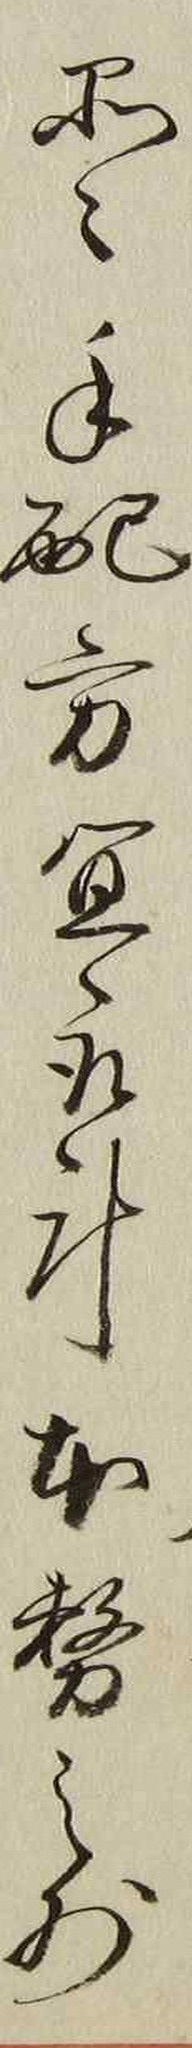品々手配方宜取計本務之外
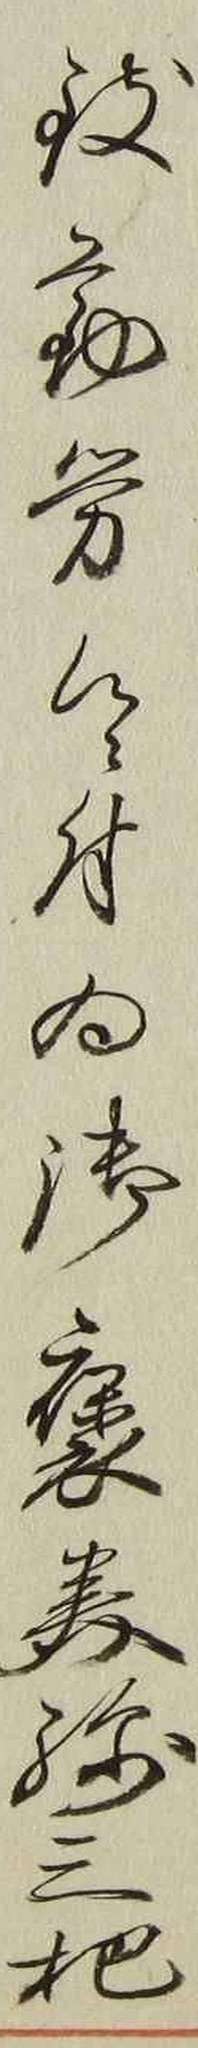致勤労候ニ付為御褒美綿三把
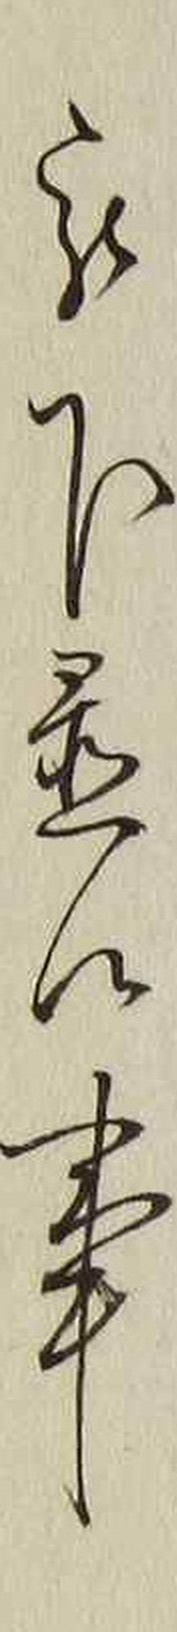被下置候事
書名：諸士系譜　巻之54　ほ之部1
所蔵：会津若松市立会津図書館
